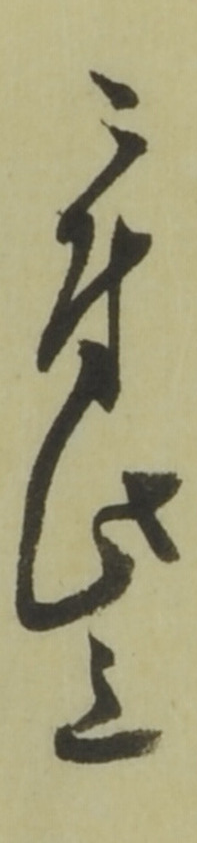ニ付此上
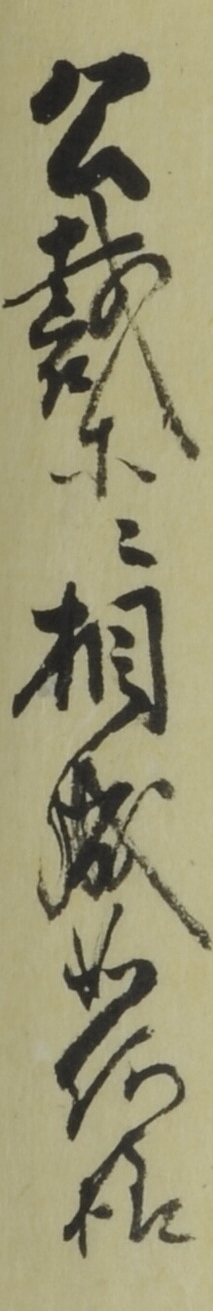公裁等ニ相成如何様
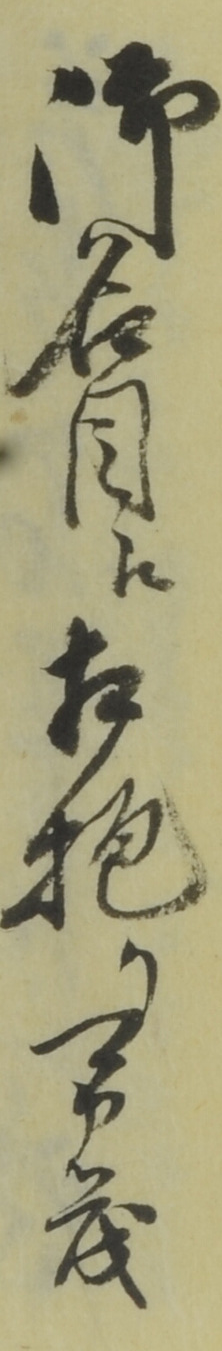御名目江相拘り可申も
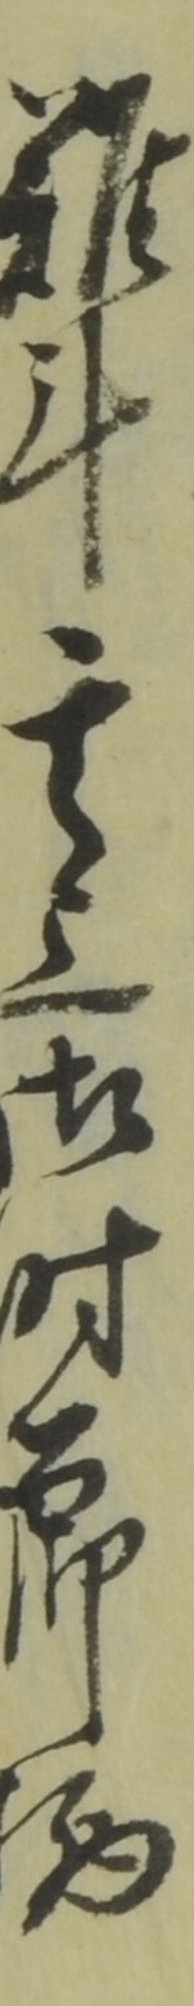難計其上御時節柄

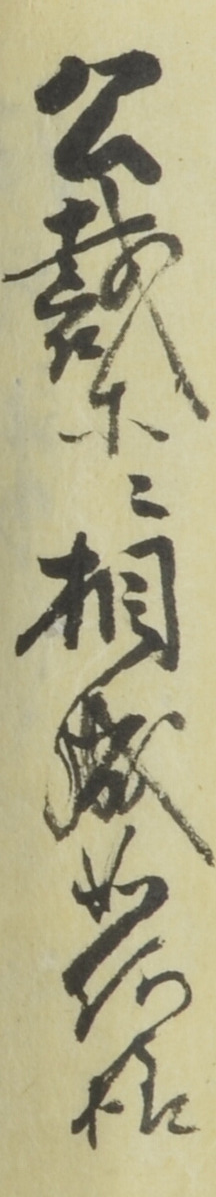公裁等ニ相成如何様
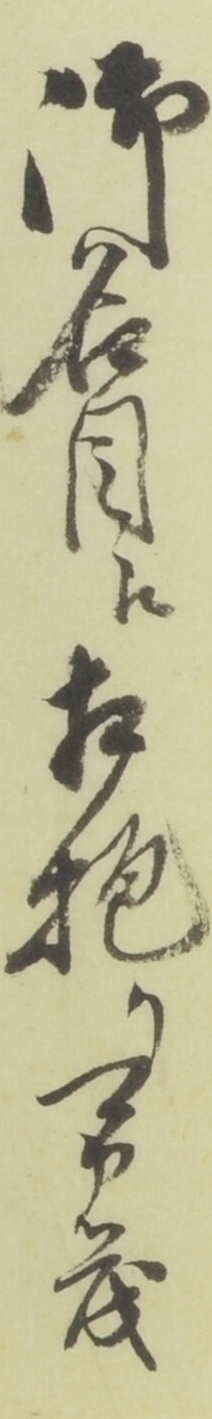御名目江相拘り可申も
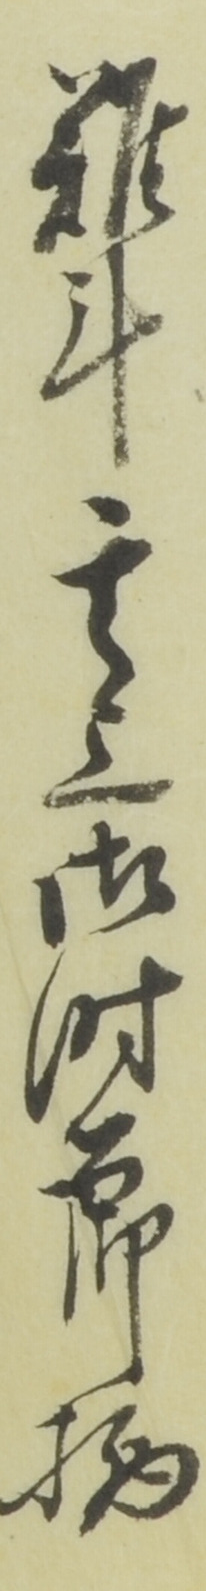難計其上御時節柄
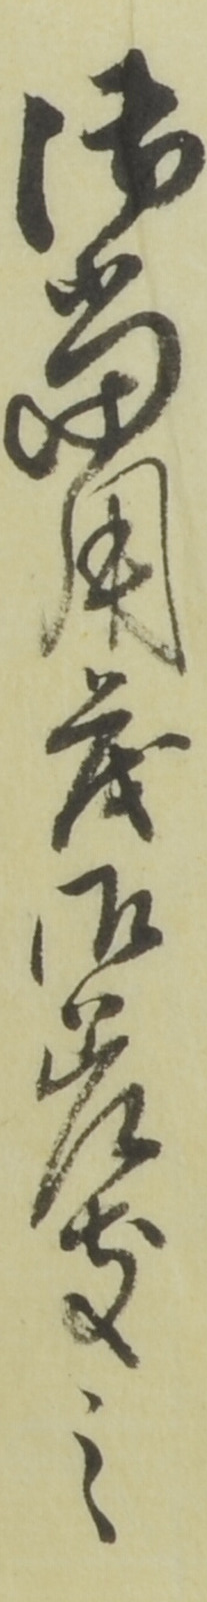御当用も御差支之
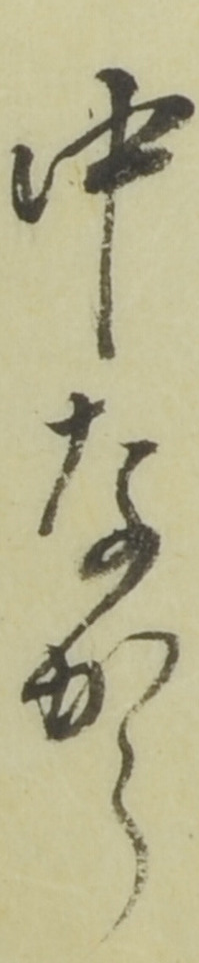中なから
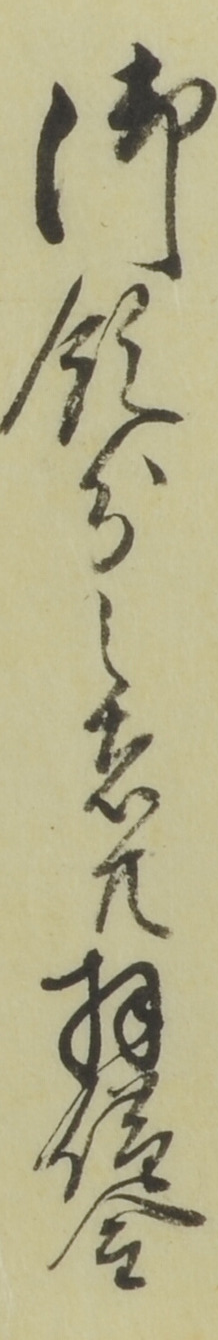御領分之者共拝借金
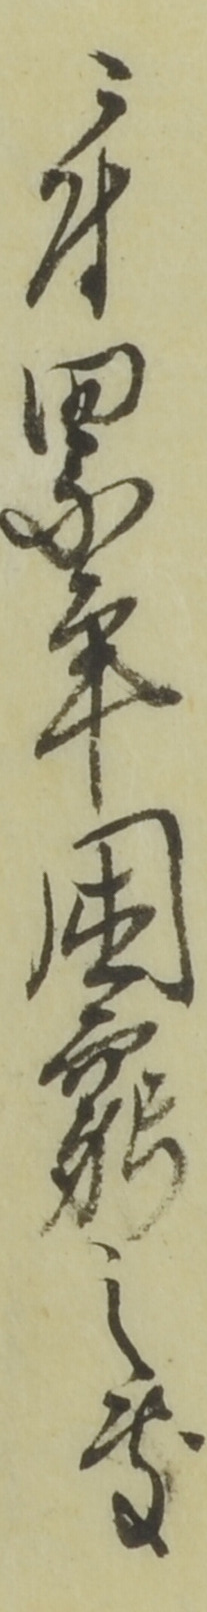ニ付累年困窮之処
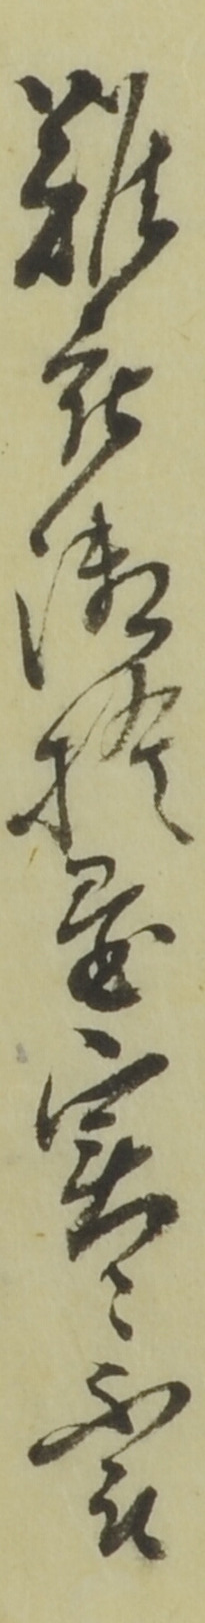難被御捨置実ニ不被
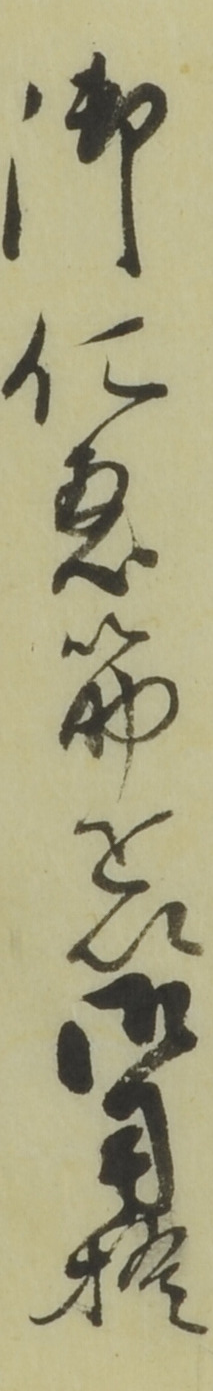御仁恵筋を以御用捨
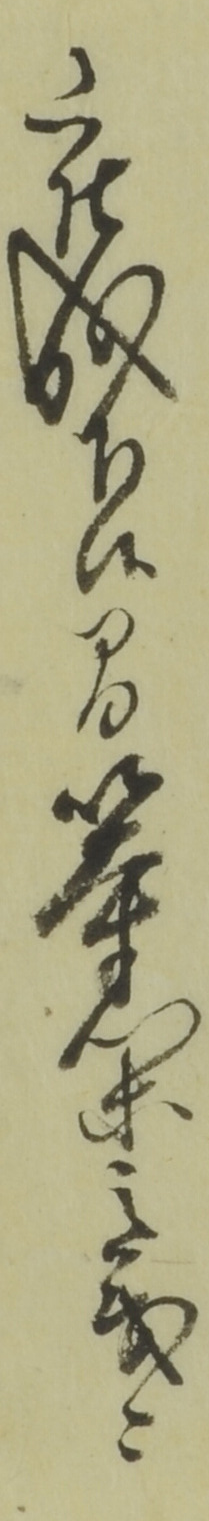被成下候間等閑之義ニ
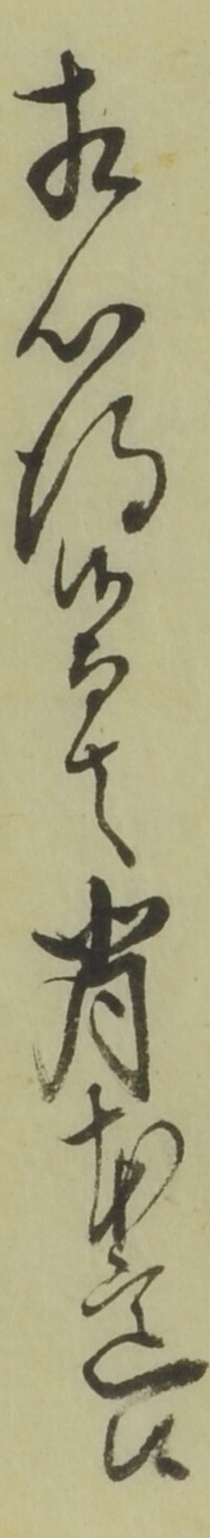相心得候而は背本意候
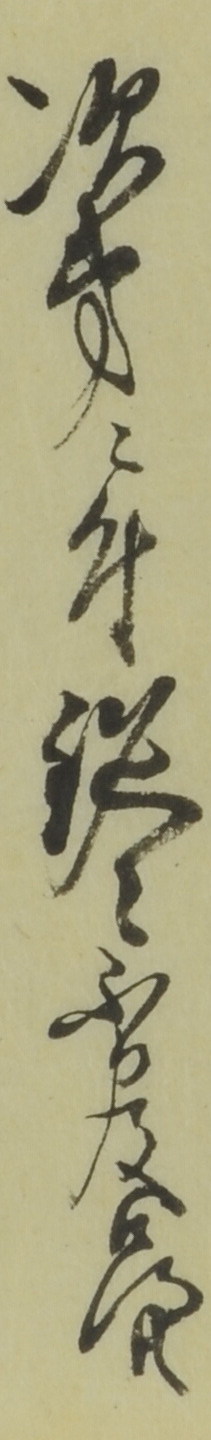次第ニ付銘々不申及候得共
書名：御触書御書附控
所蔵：伊那市立高遠町図書館・合同会社AMANE
